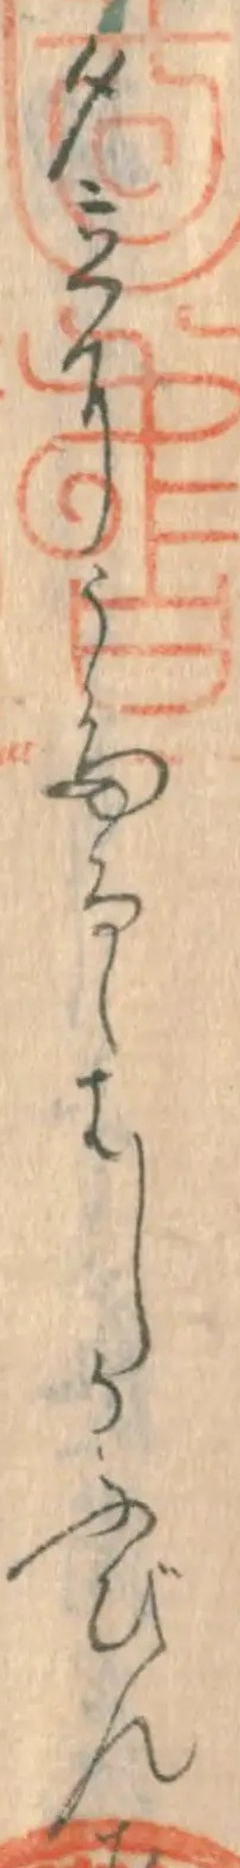夕立にうたるゝはしかふびんなり
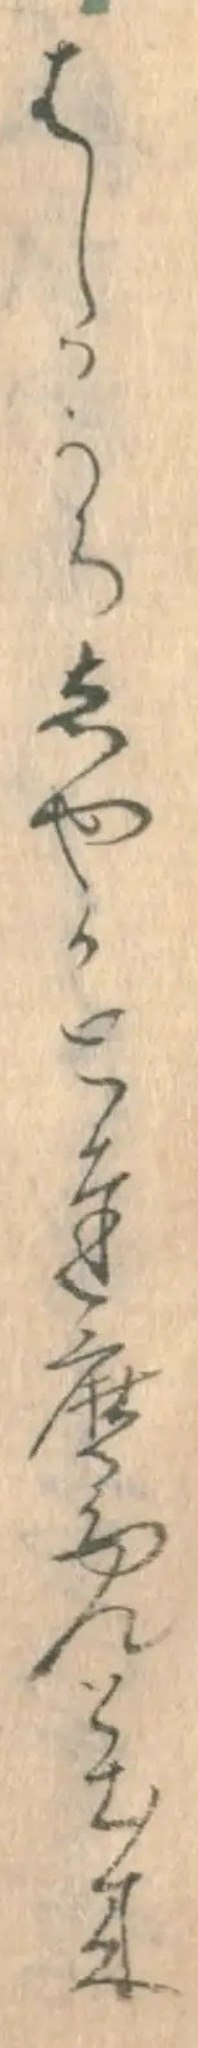はしかから釈迦と達磨たんと出来
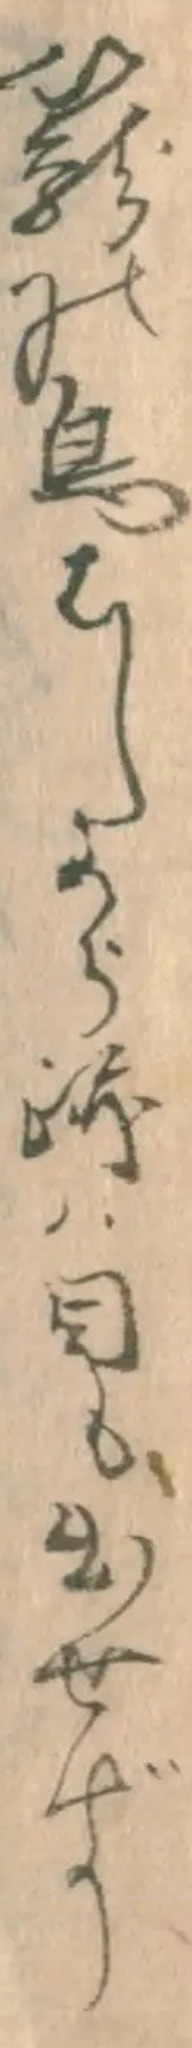籠の鳥はしから跡は目も出せず

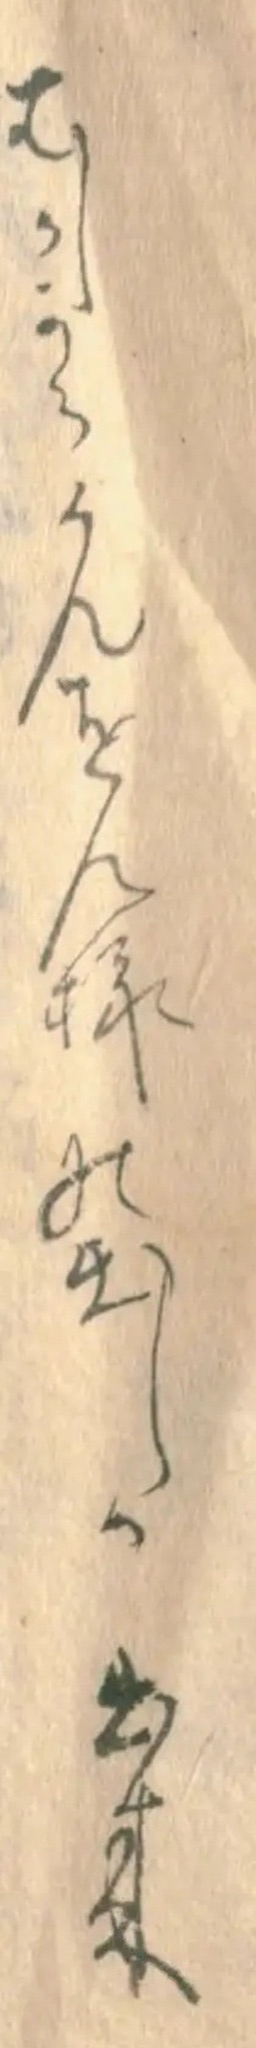はしかからかんをん様の出しが出来
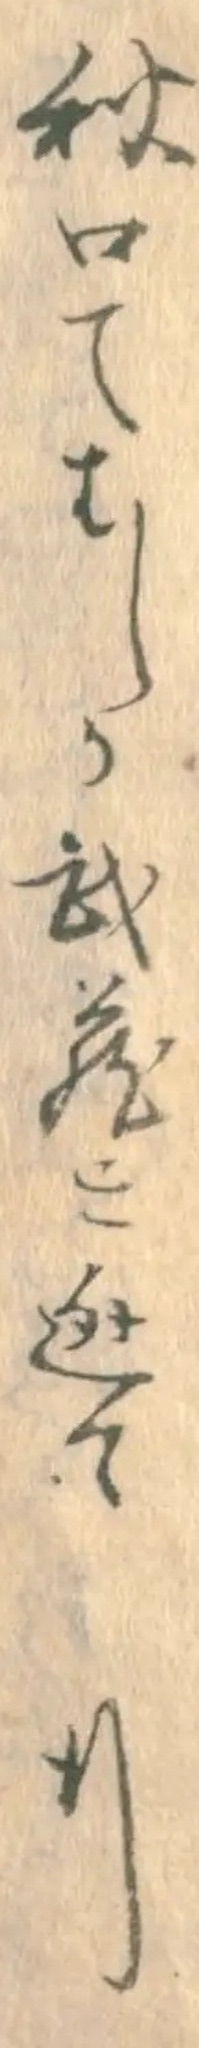秋口ではしか武蔵と逃て行
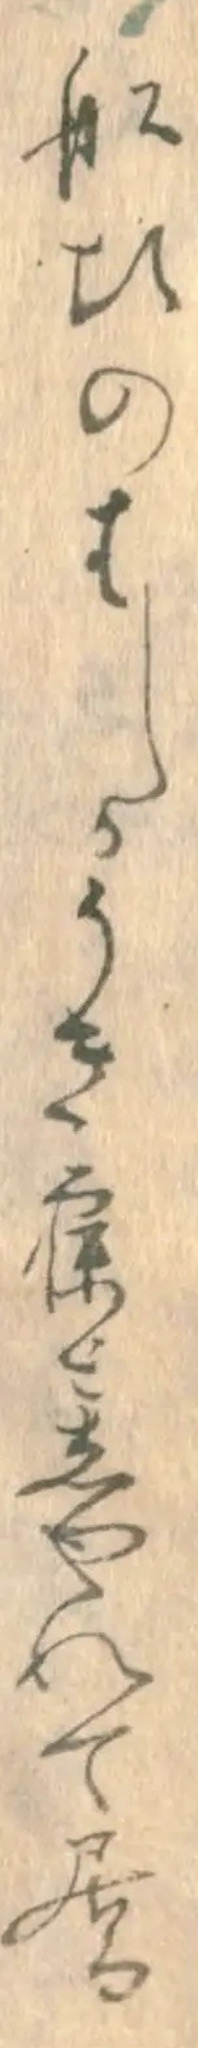船頭のはしかうき寝としやれて居る
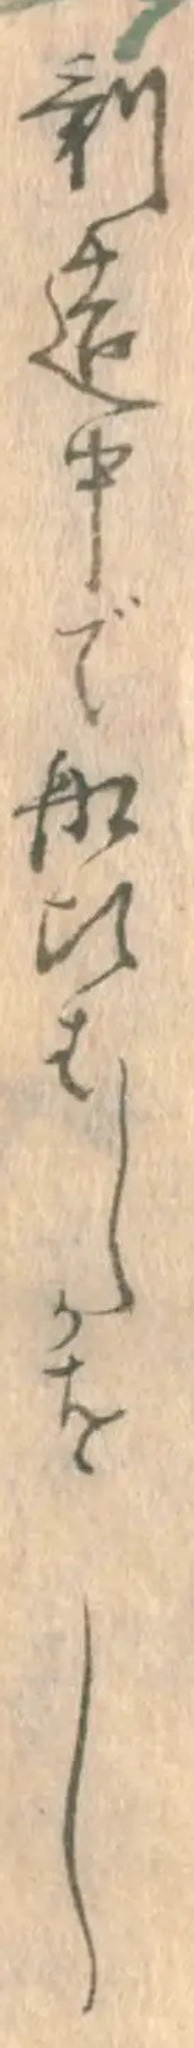新造中で船頭はしかをし
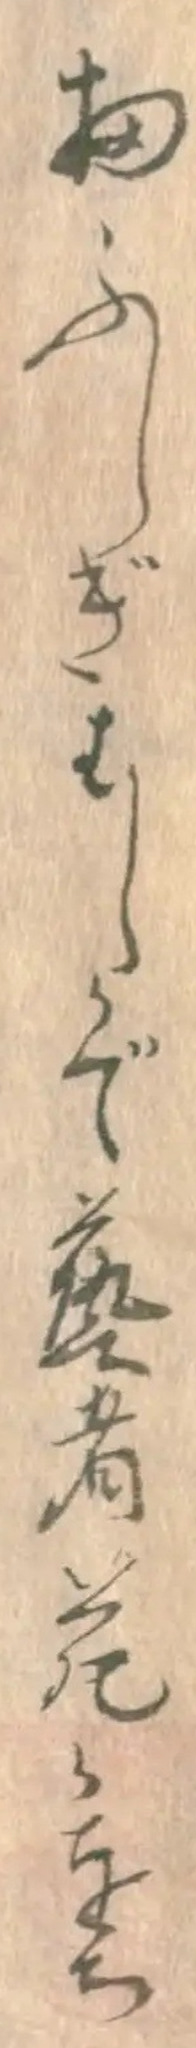扨ふしぎはしかで芸者花がおち
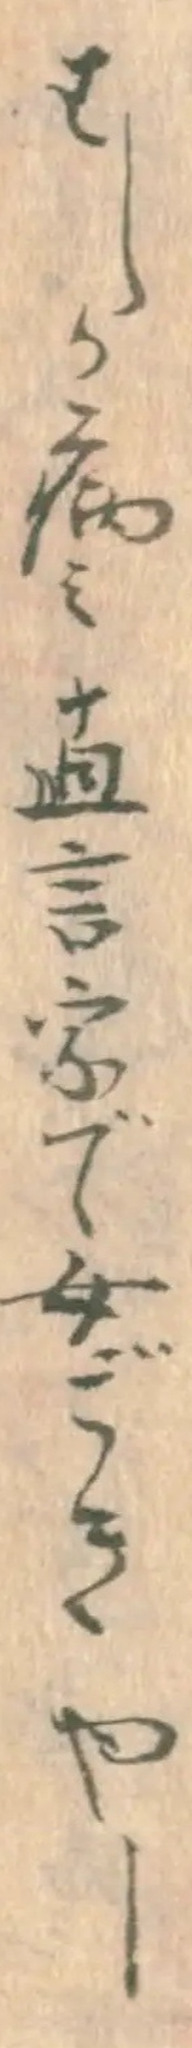はしか病を直言家で女ごときやし
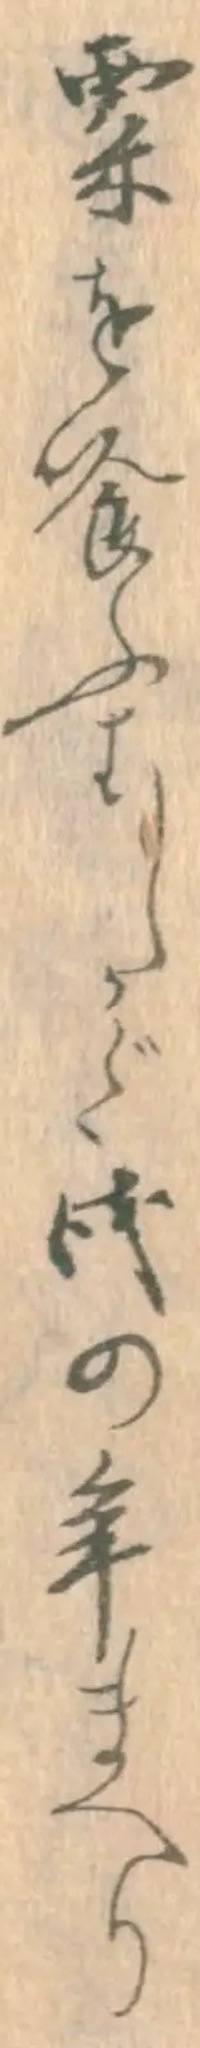栗を喰ふはしかで戌の年まへり
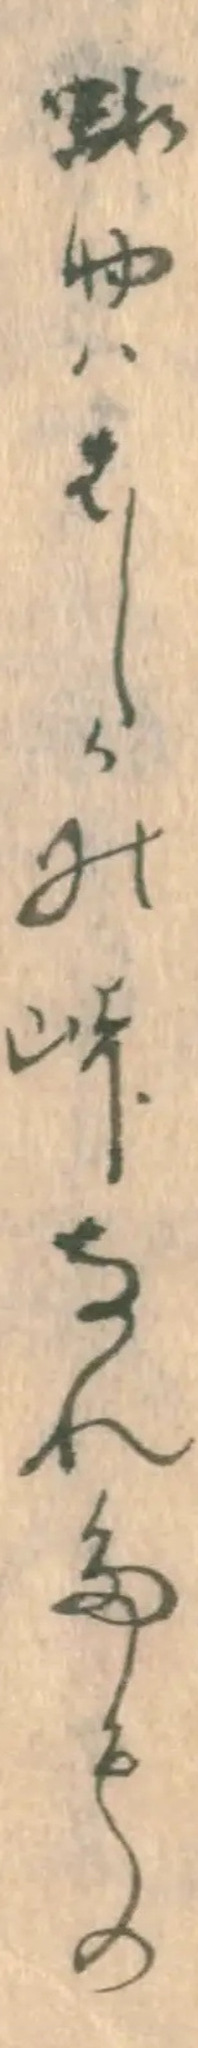蜘助ははしかの峠なれなれたもの
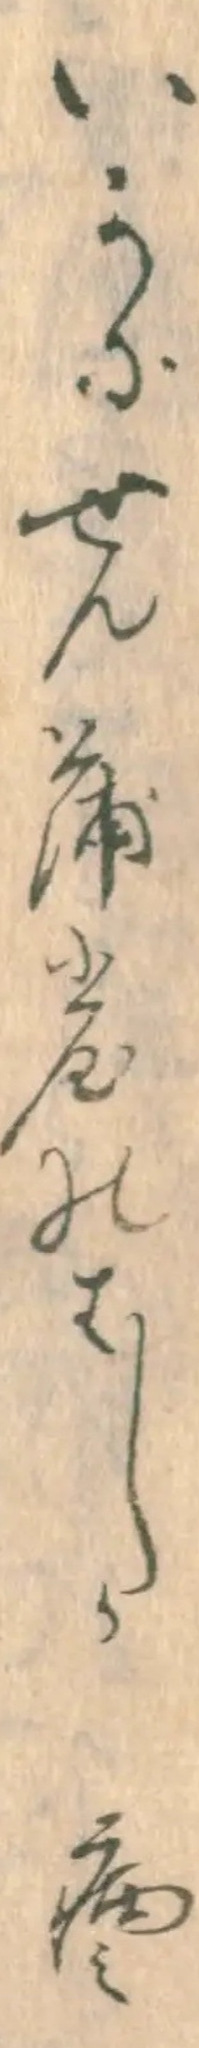いかにせん蒲小屋のはしか病み
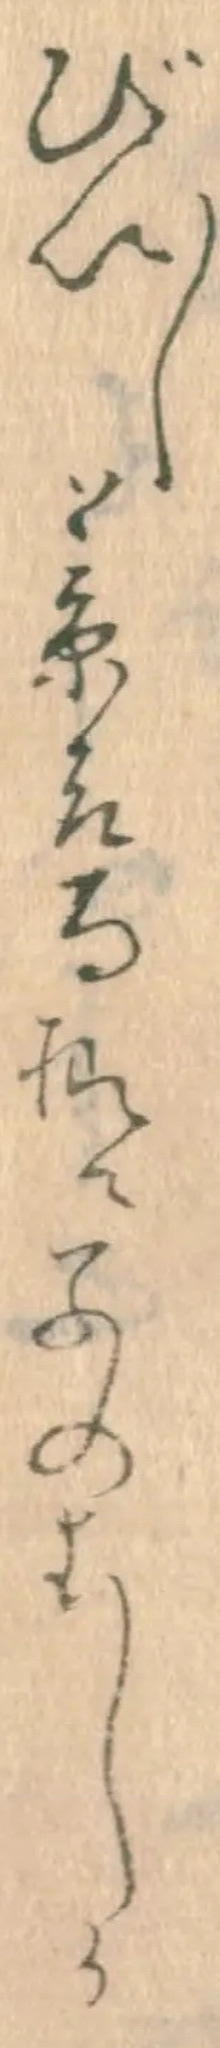びい＼と糸取る様に子のはしか
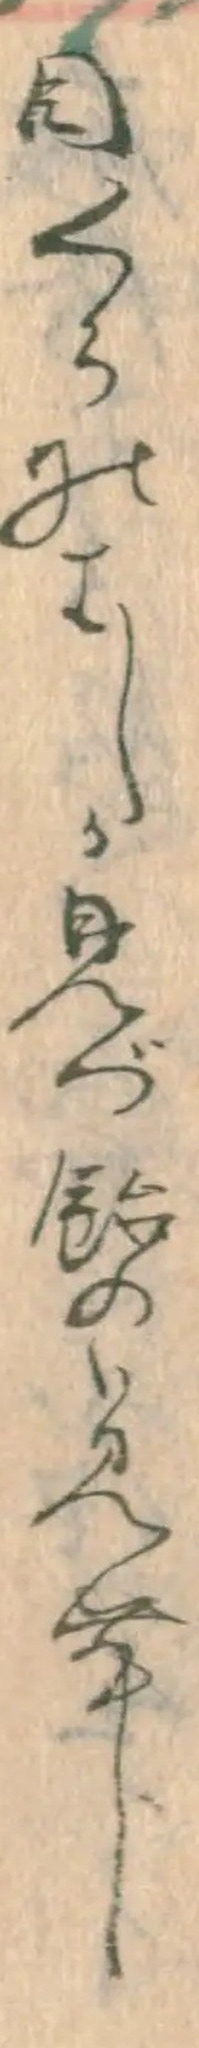目くらのはしか見づ飴の御見舞
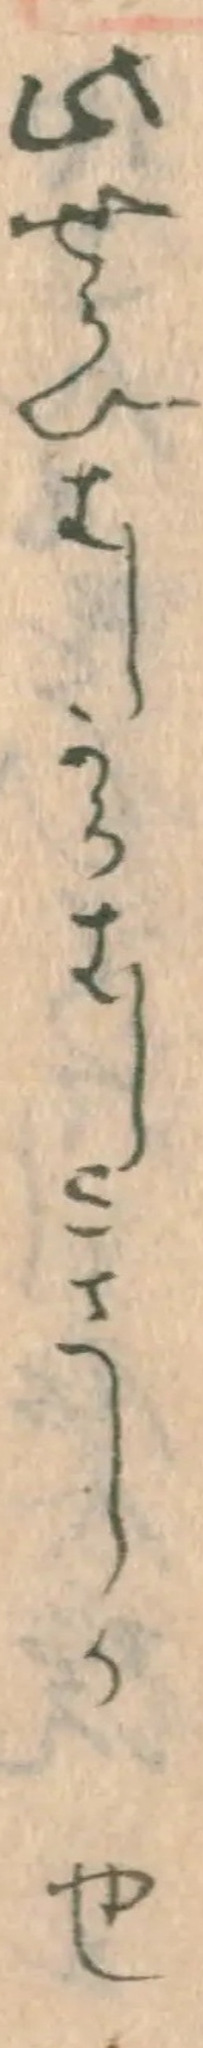此せかいはしかかはしとさしか也
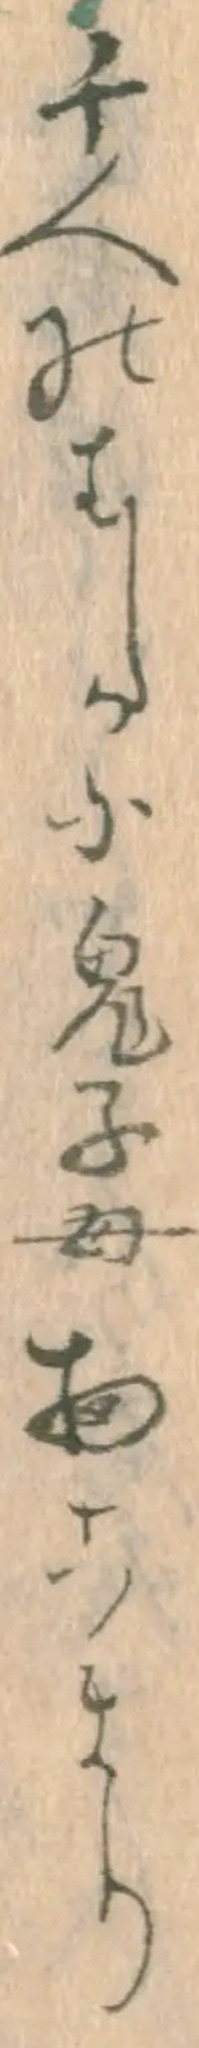千人のはしかに鬼子母扨こまり
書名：麻疹後柳樽
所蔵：国立国会図書館 National Diet Library, JAPAN
